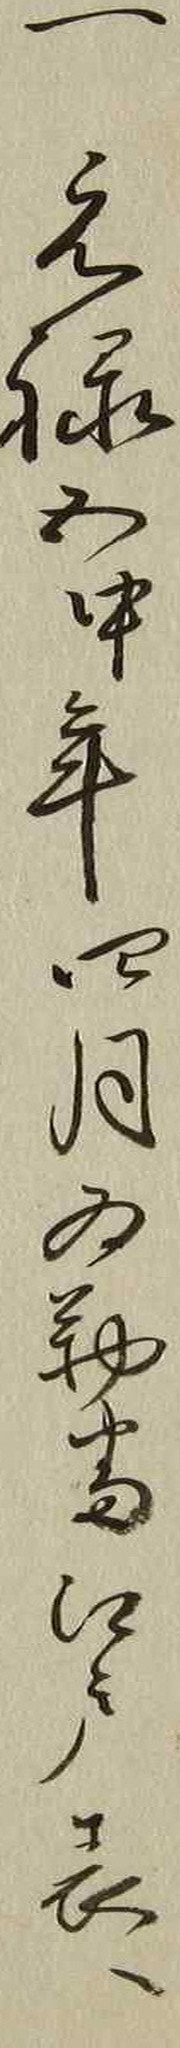一元禄五申年四月為勤番江戸表へ
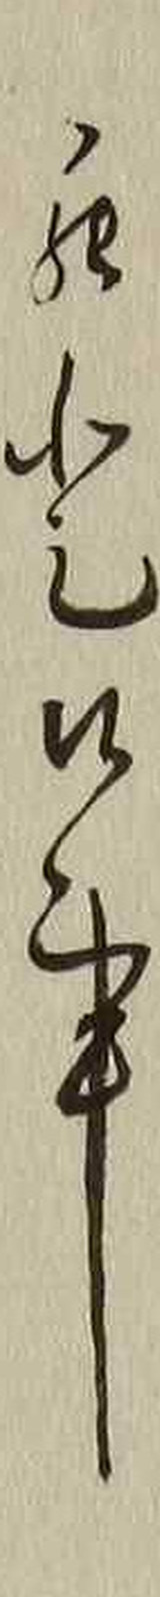罷登候事
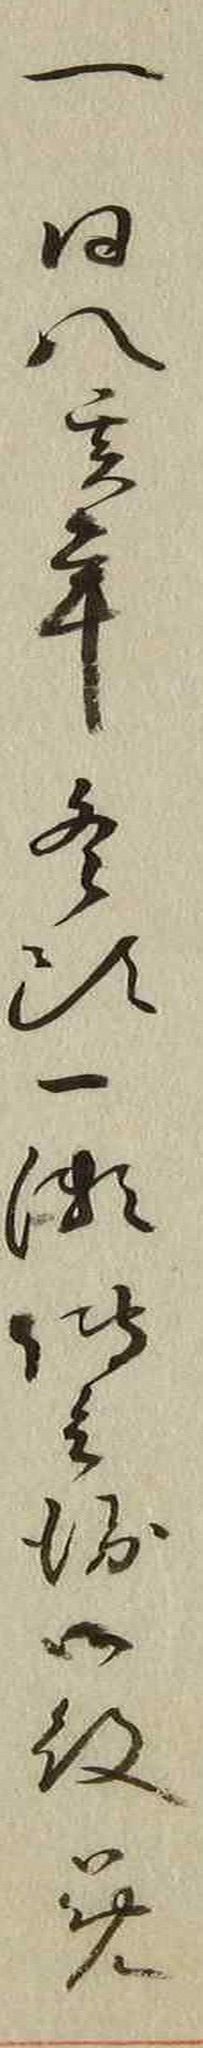一同八亥年冬頭一瀬傳兵衛御役御免
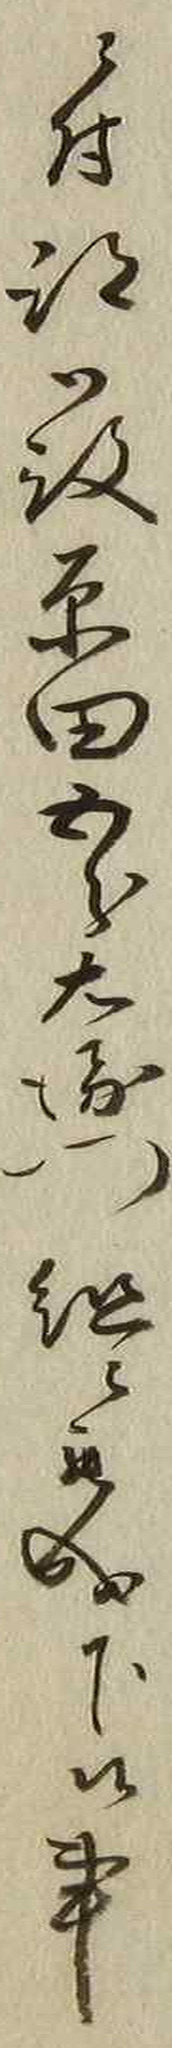に付跡御役原田五郎右衛門組に被成下候事
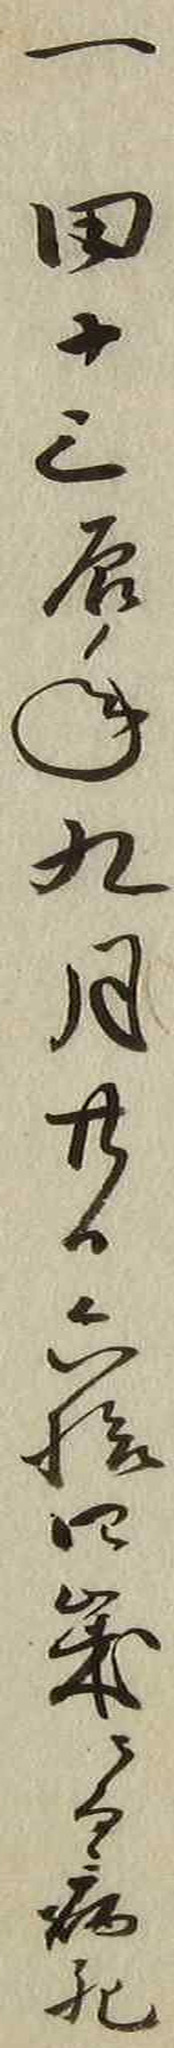一同十三辰年九月廿日六拾四歳に而病死
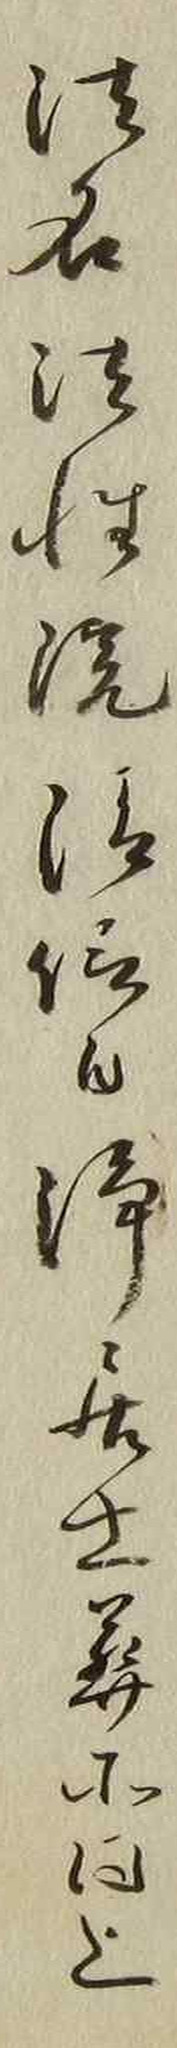法名法性院清信日浄居士葬所同上
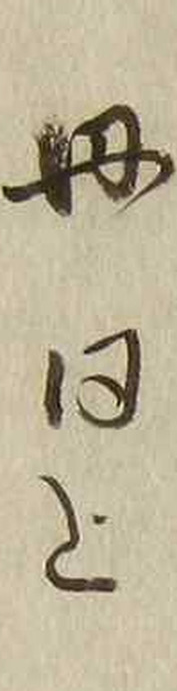母同上

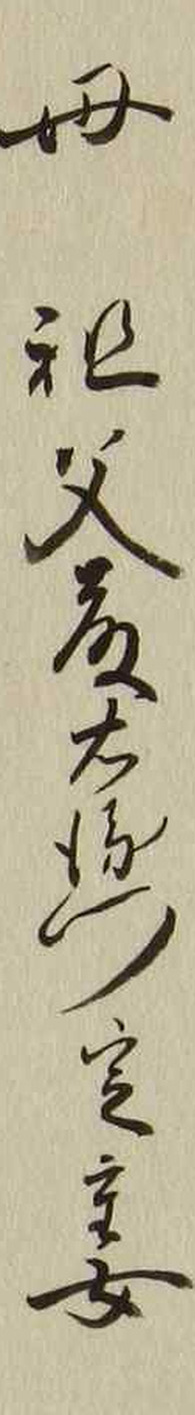母祖父藤右衛門定重女
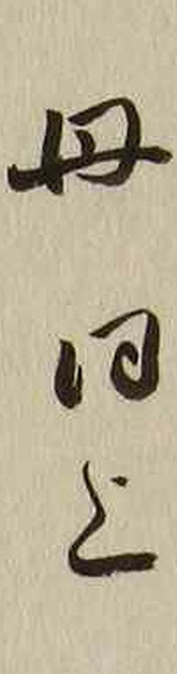母同上
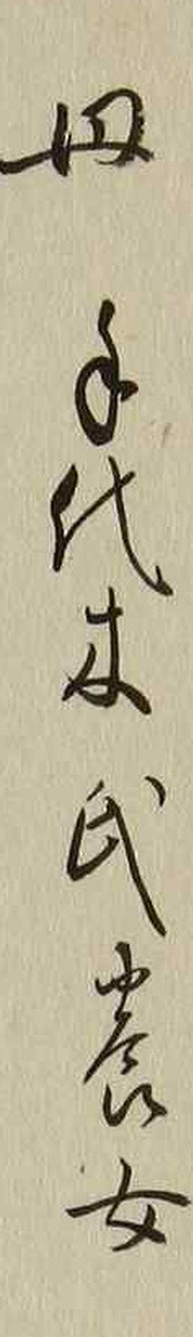母手代木氏養女
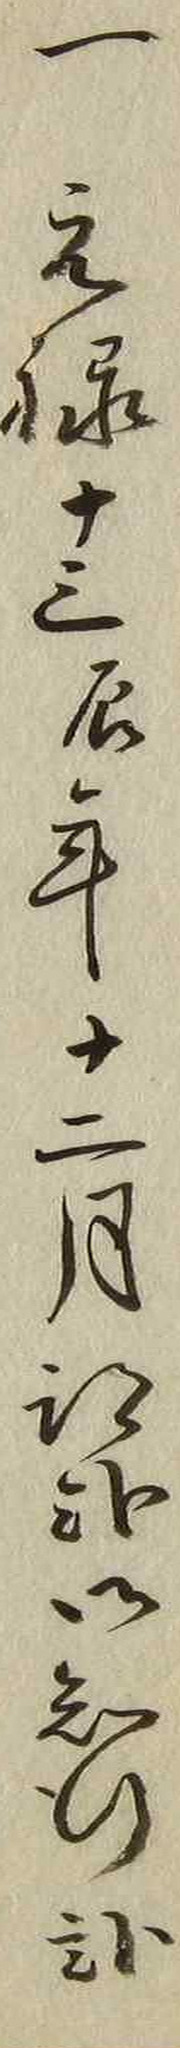一元禄十三辰年十二月跡式御知行弐
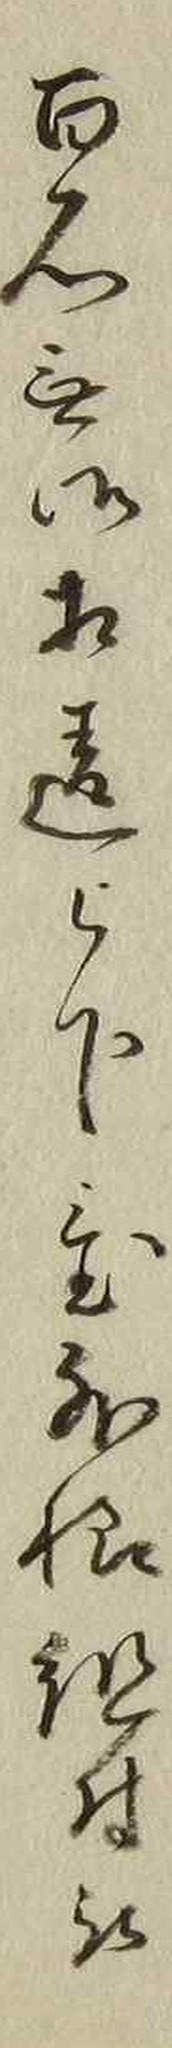百石無御相違被下置外様組付被
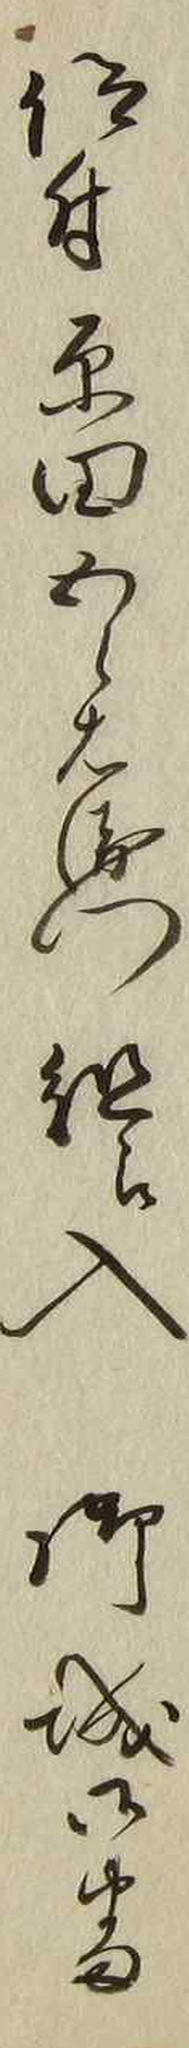仰付原田五郎右衛門組江入御城御番
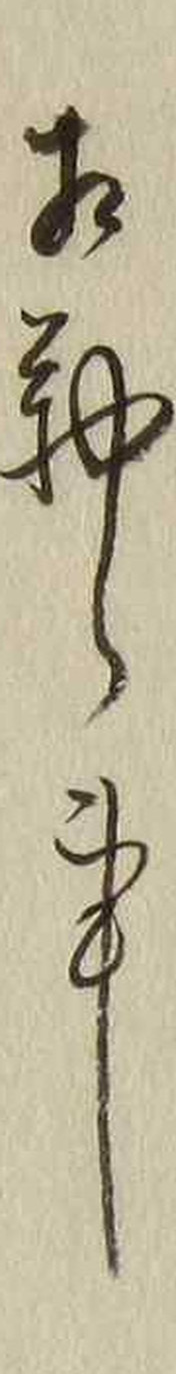相勤候事
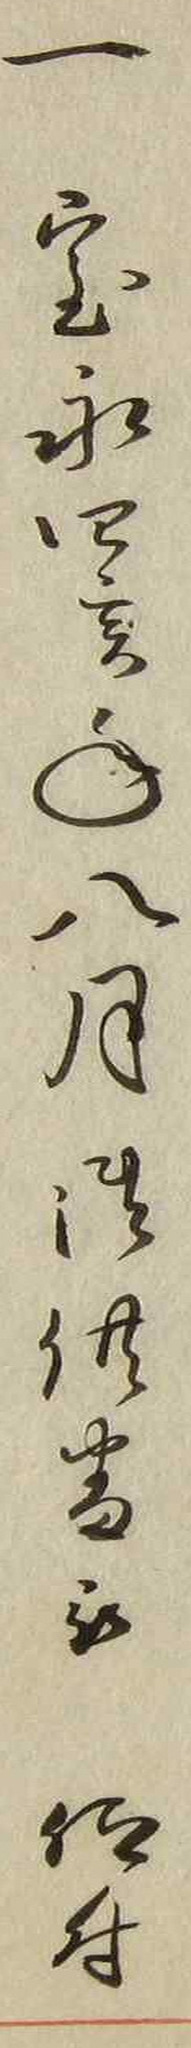一宝永四亥年八月御供番被仰付

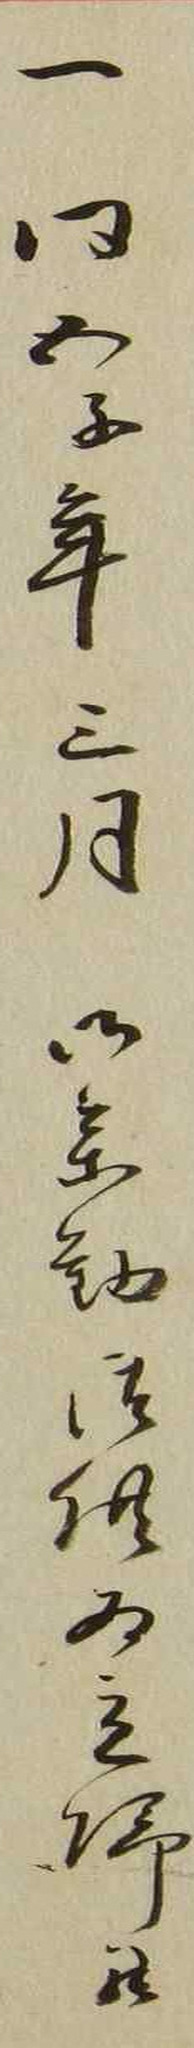一同五子年三月御参勤御供為立帰罷
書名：諸士系譜　巻之3　い之部3
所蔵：会津若松市立会津図書館
